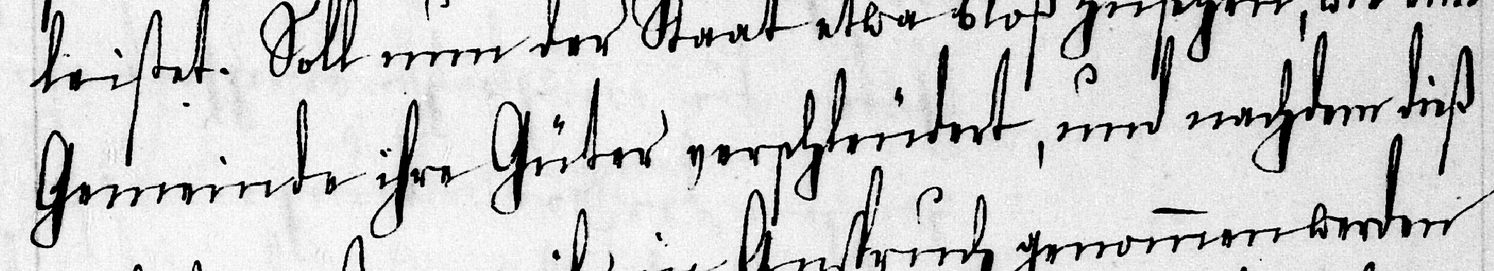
Gemeinde ihre Güter verschleudert, und nachdem dieß
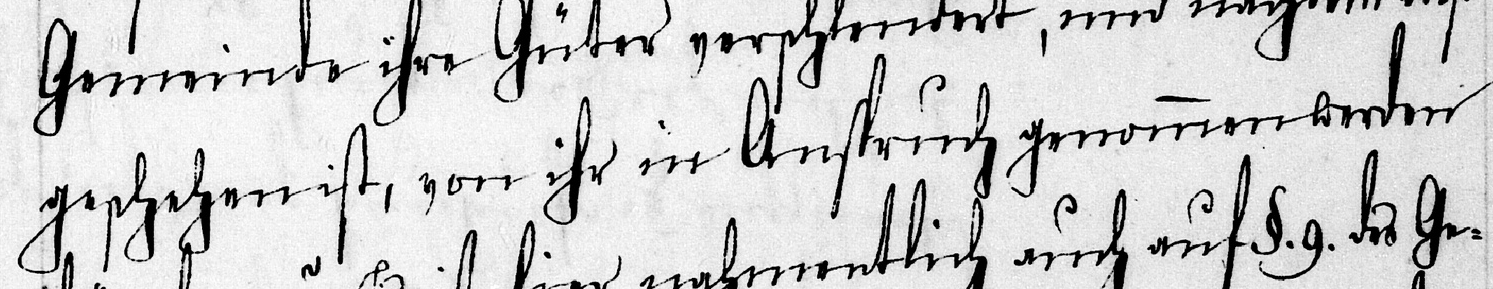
geschehen ist, von ihr in Anspruch genommen werden
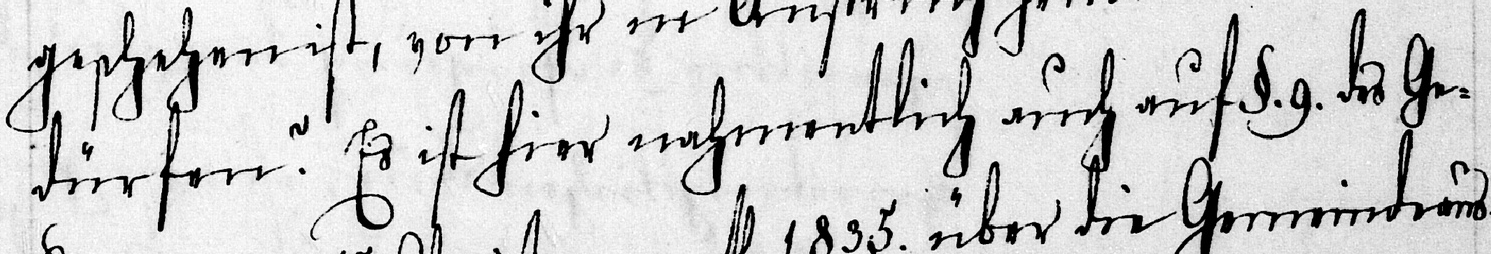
dürfen? Es ist hier nahmentlich auch auf §. 9. des
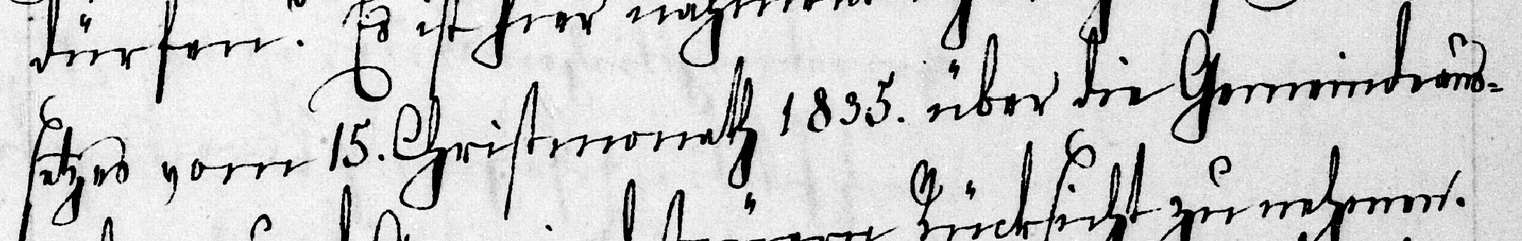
setzes vom 15. Christmonath 1835. über die Gemeindeaus¬
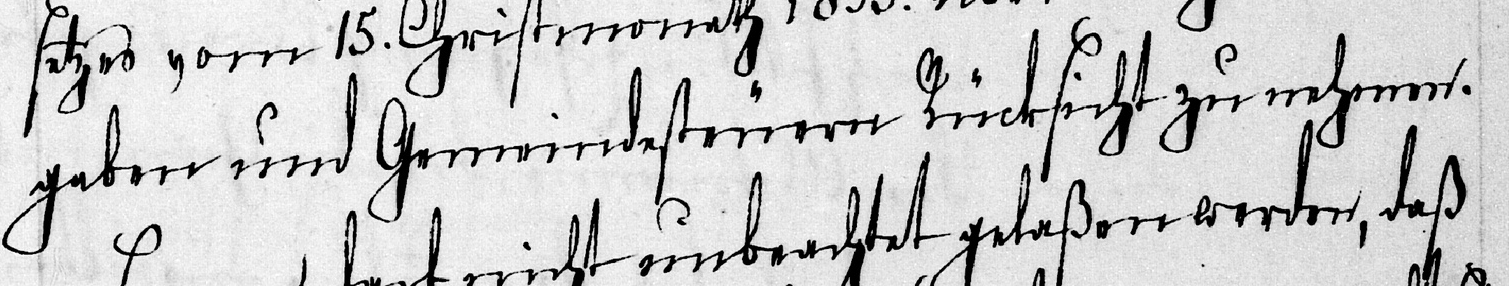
gaben und Gemeindesteuern Rücksicht zu nehmen.
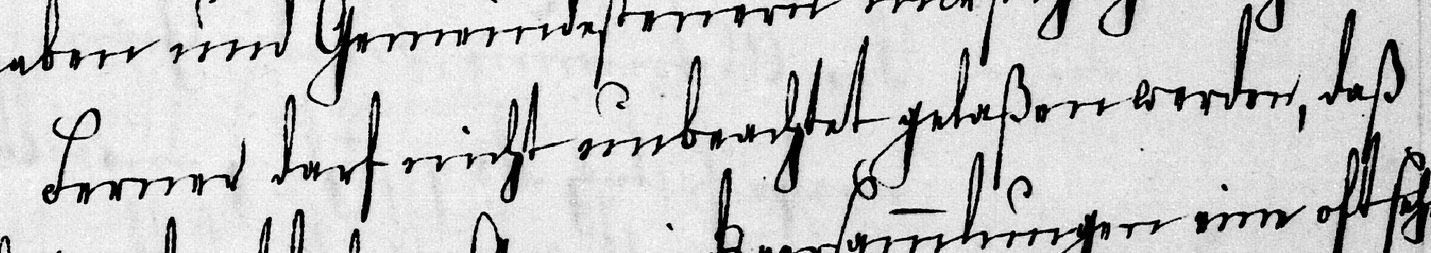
Ferner darf nicht unbeachtet gelaßen werden, daß
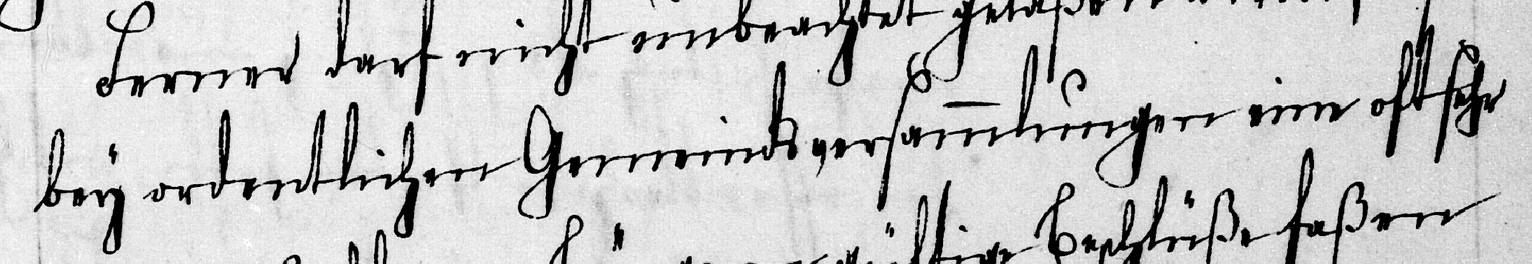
bey ordentlichen Gemeindsversammlungen eine oft sehr
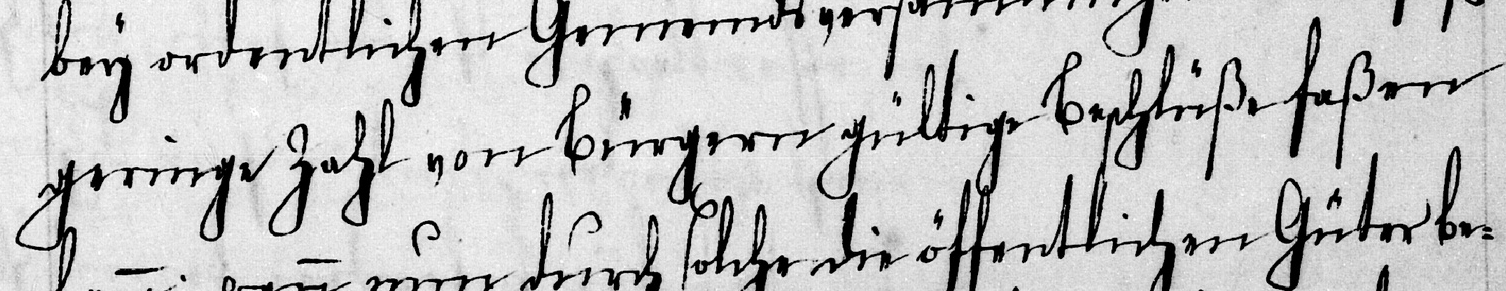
geringe Zahl von Bürgern gültige Beschlüße faßen
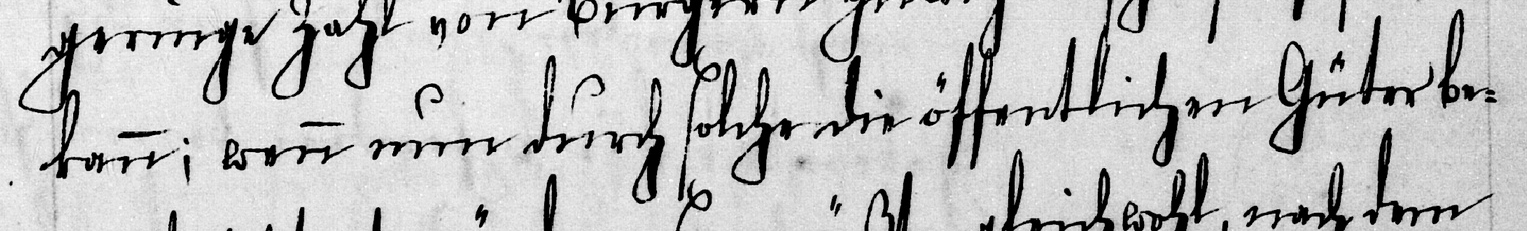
kann; wenn nun durch solche die öffentlichen Güter be¬
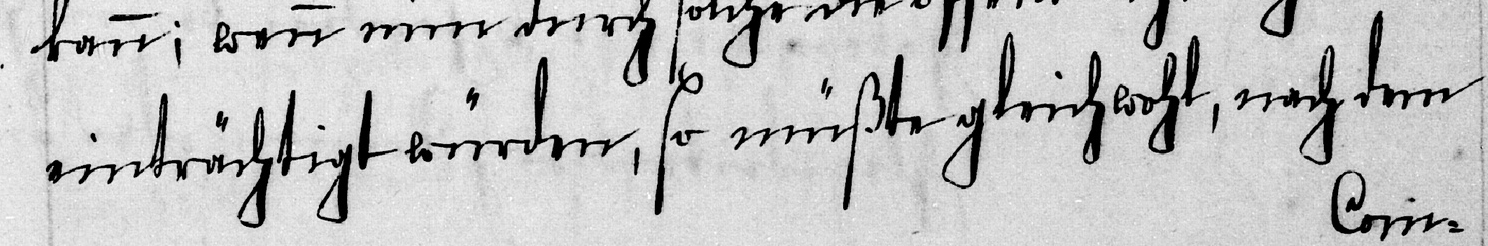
einträchtigt werden, so müßte gleichwohl, nach dem
